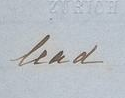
lead
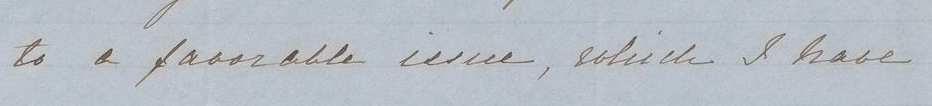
to a favorable issue, which I have
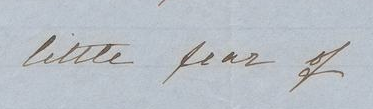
little fear of
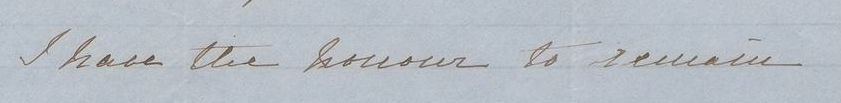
I have the honour to remain
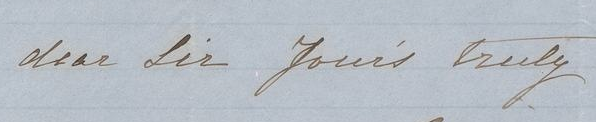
dear Sir Your's truly
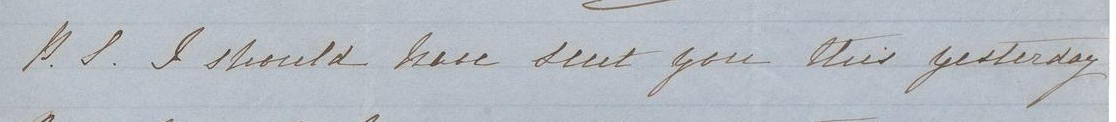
P. S. I should have sent you this yesterday
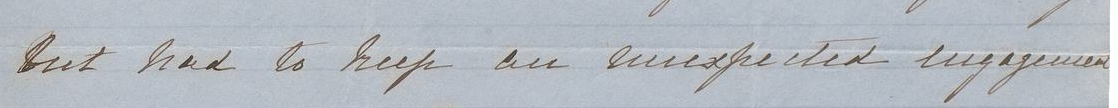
but had to keep an unexpected engagement
